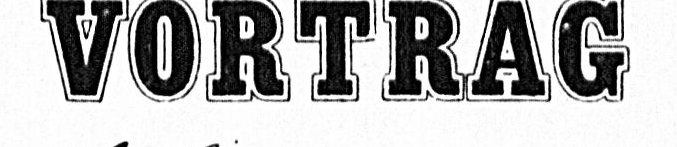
VORTRAG
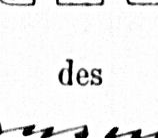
des
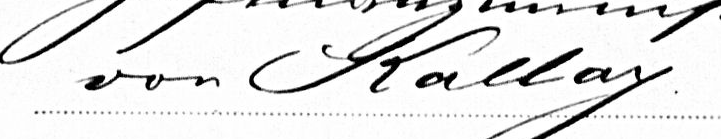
von Kallay.
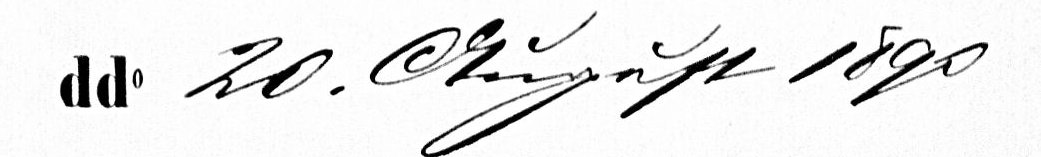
dd° 20. August 1890
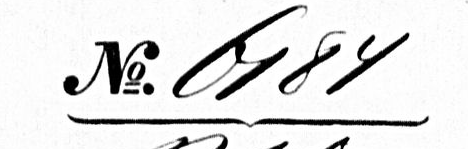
N° 6184/
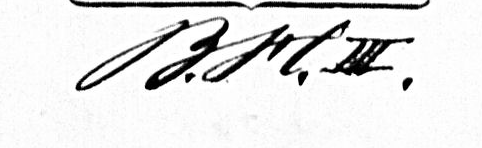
B.H.III.
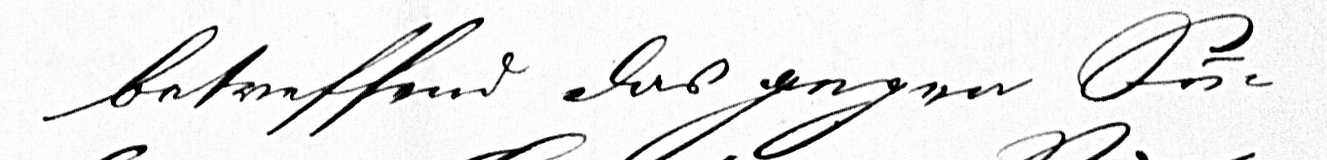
betreffend das gegen Su¬
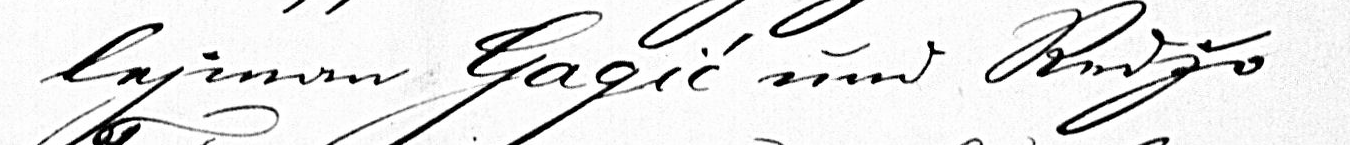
lejman Gagić und Redžo
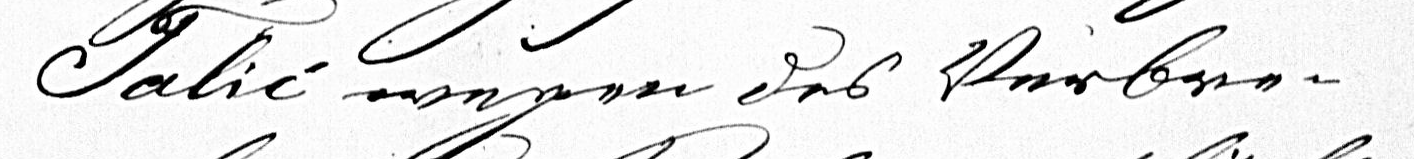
Talić wegen des Verbro¬
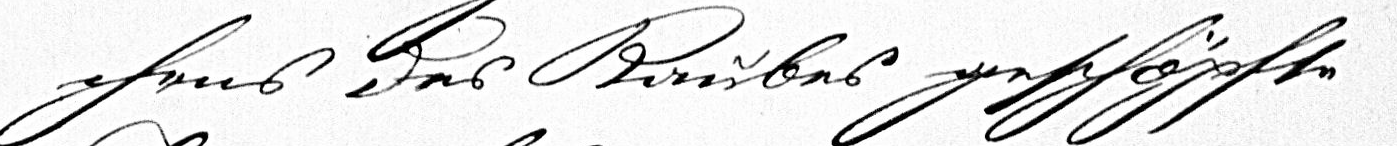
chens des Raubes geschöpfte
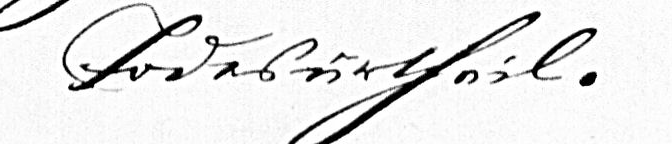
Todesurtheil.
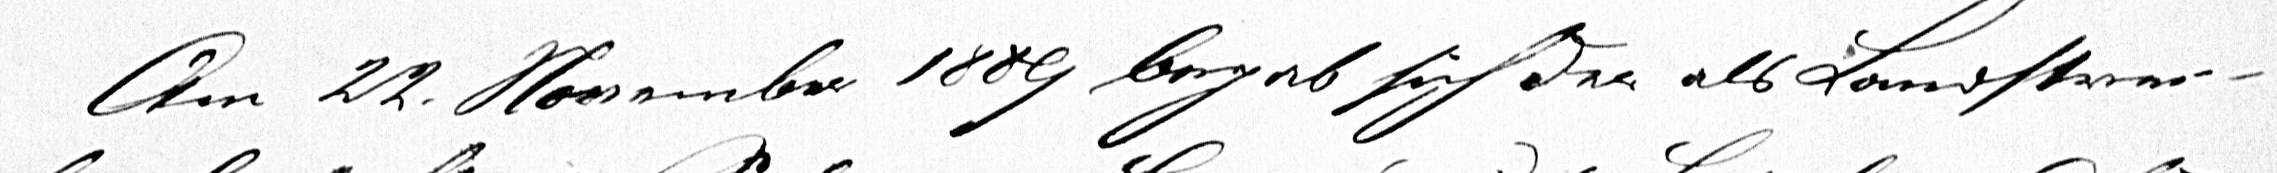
Am 22. November 1889 begab sich der als Landstrei¬
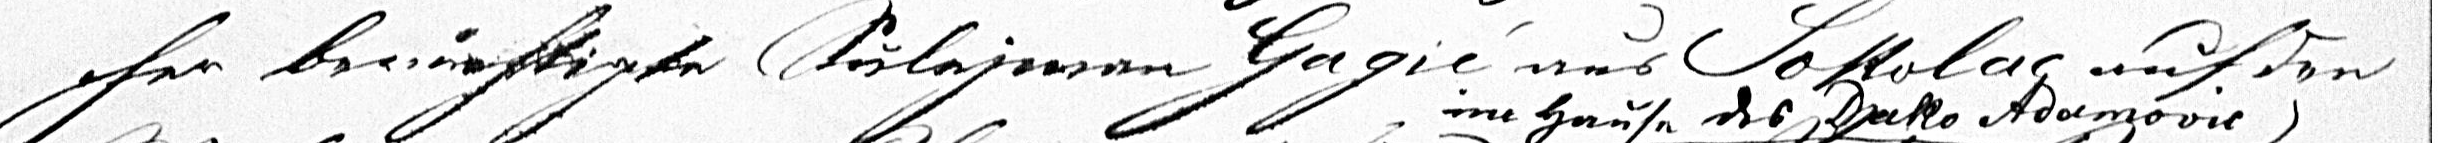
cher berichtigte Sulejman Gagić aus Soxxolac auf den
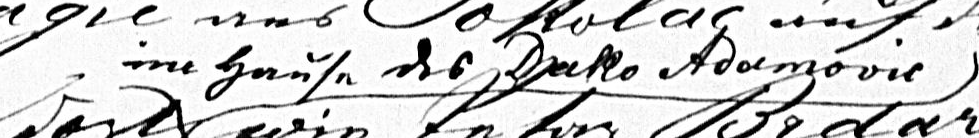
im Hause des Dako Adamovic
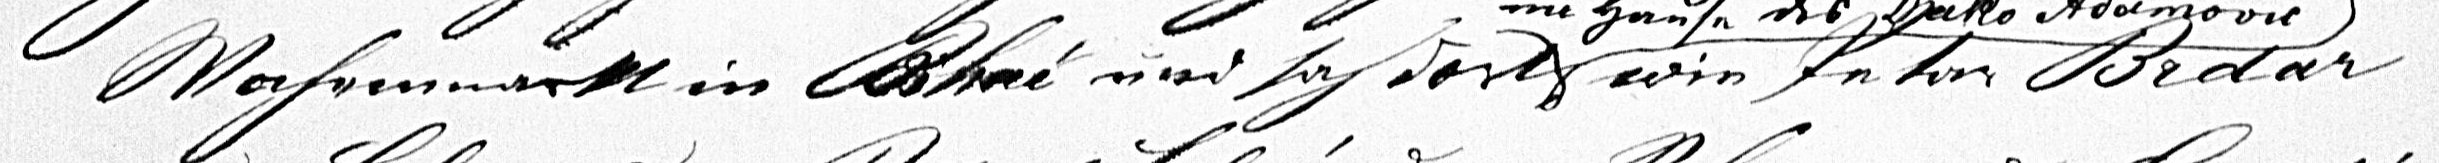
Wahrenmarkt in Bohač und sah dort wie Petar Brdar
